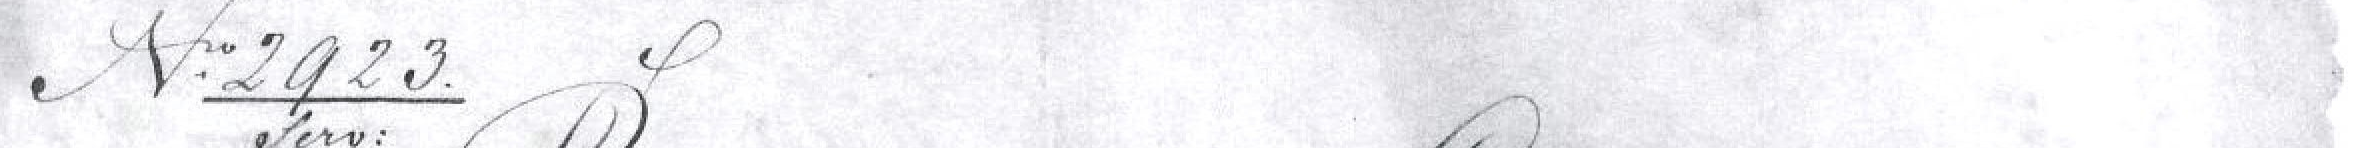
№ 2923
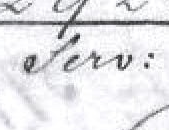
Serv.
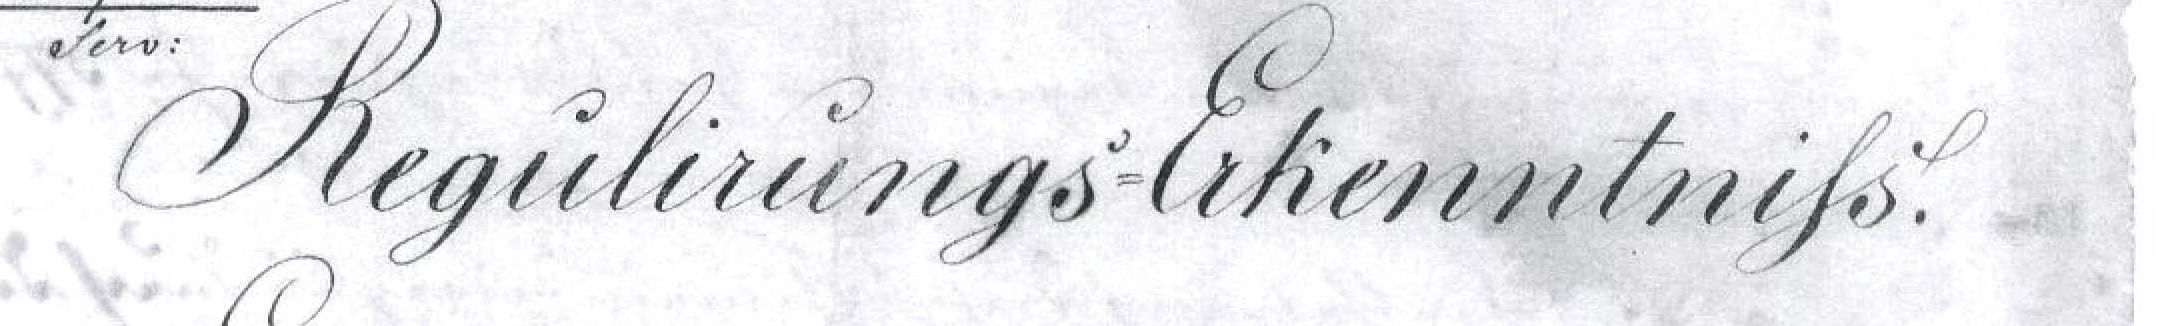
Regulirungs=Erkenntniss.
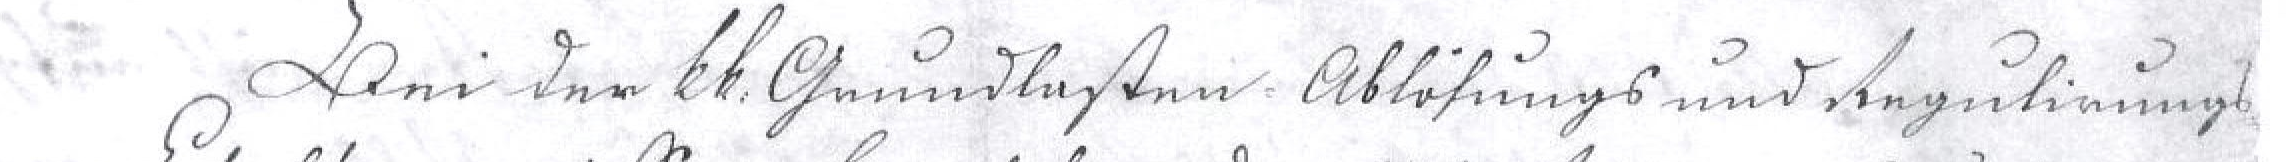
Bei der kk. Grundlasten=Ablösungs und Regulirungs
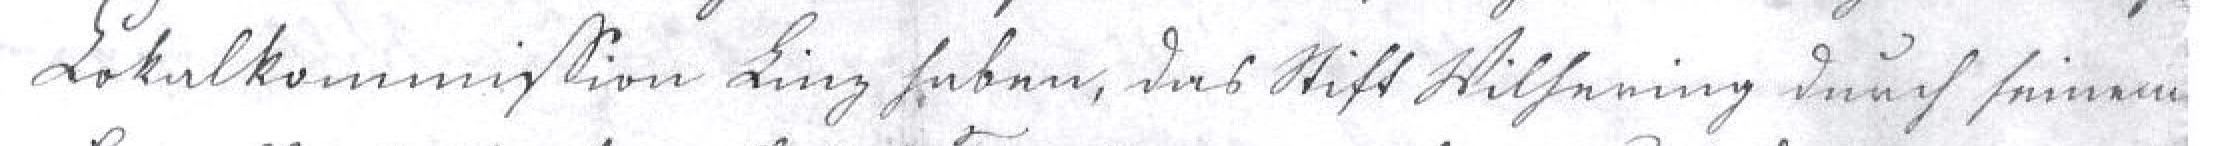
Lokalkommission Linz haben, das Stift Wilhering durch seinem
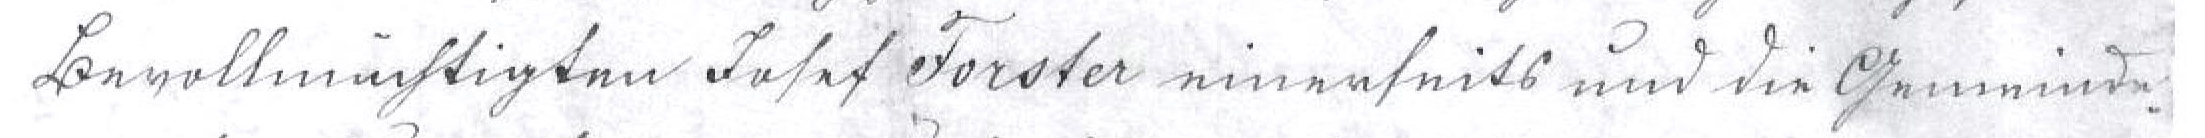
Bevollmächtigten Josef Forster einerseits und die Gemeinde¬
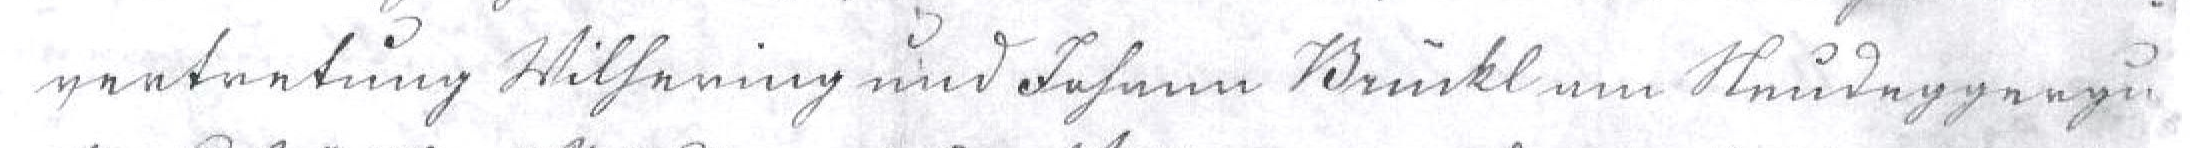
vertretung Wilhering und Johann Brückl am Neudeggergu¬
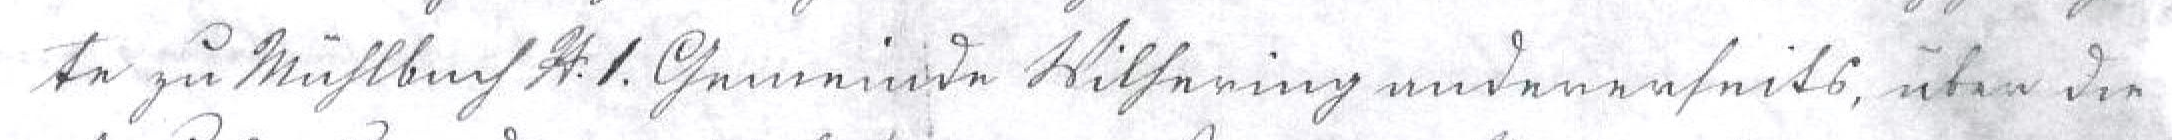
te zu Mühlbach № 1. Gemeinde Wilhering andererseits, über die
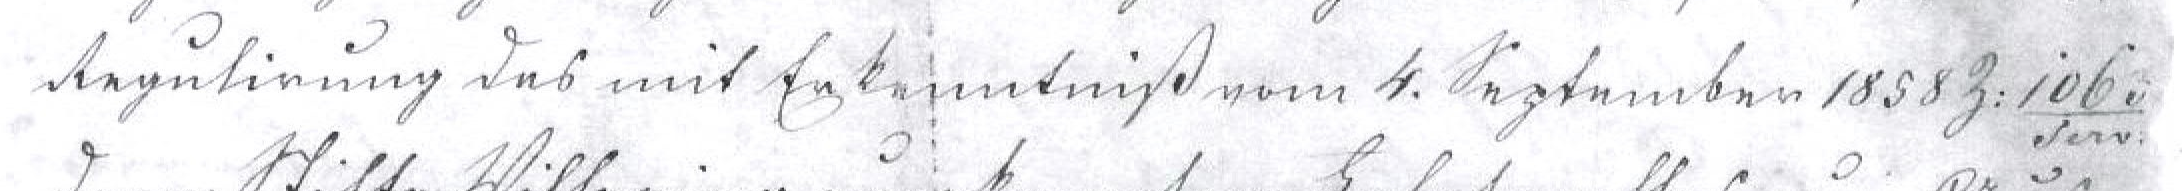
Regulirung des mit Erkenntniß vom 4. September 1858 Z: 1063 Serv
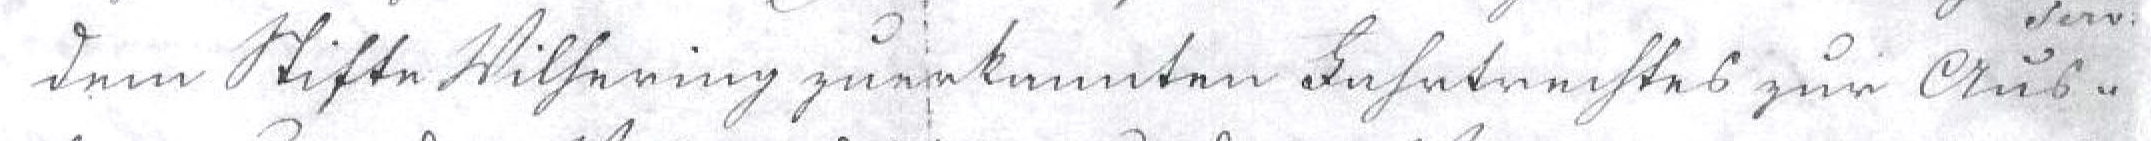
dem Stifte Wilhering zuerkannten Fahrtrechtes zur Aus¬
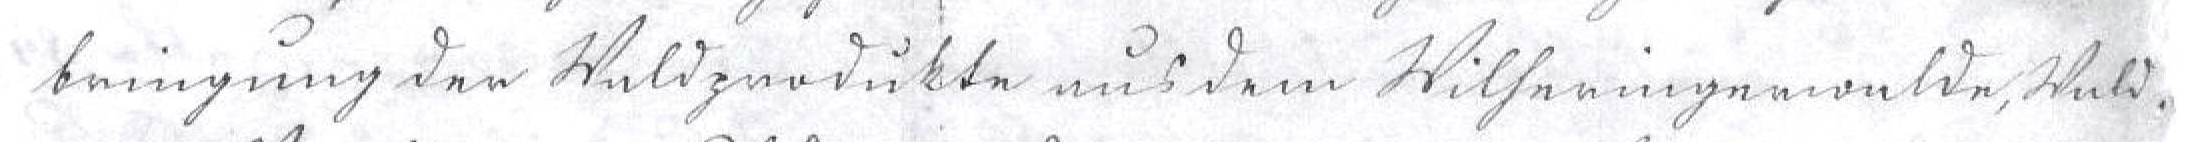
bringung der Waldprodukte aus dem Wilheringerwalde, Wald¬
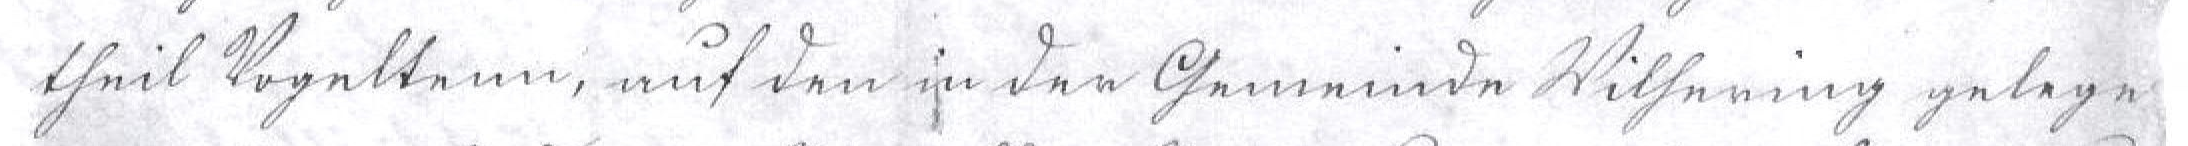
theil Vogeltenn, auf den in der Gemeinde Wilhering gelege¬
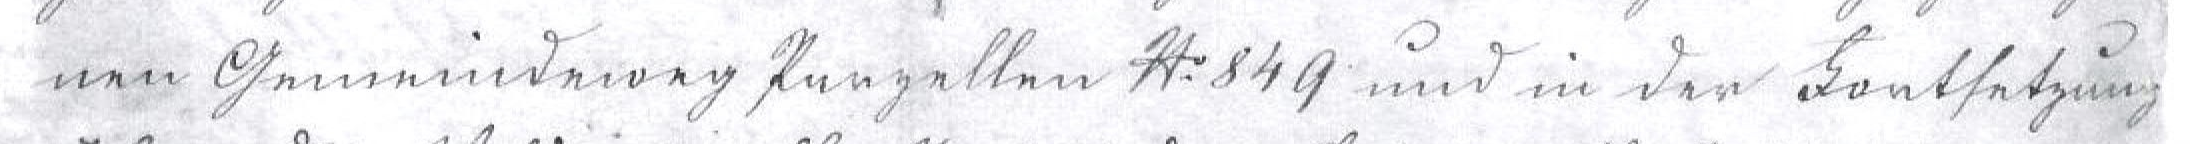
nen Gemeindeweg Parzellen № 849 und in der Fortsetzung
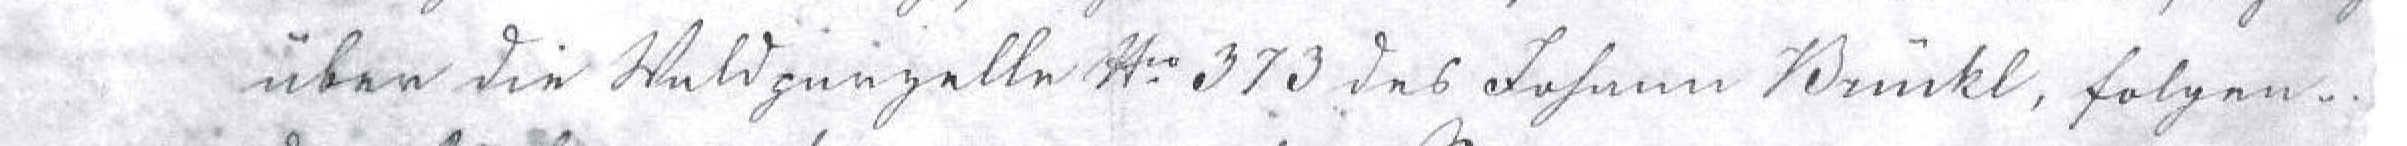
über die Waldparzelle № 373 des Johann Brückl, folgen¬
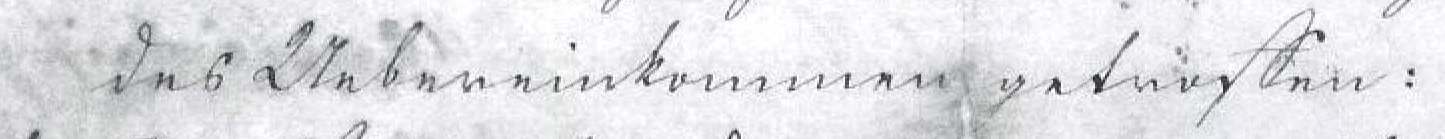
des Uebereinkommen getroffen:
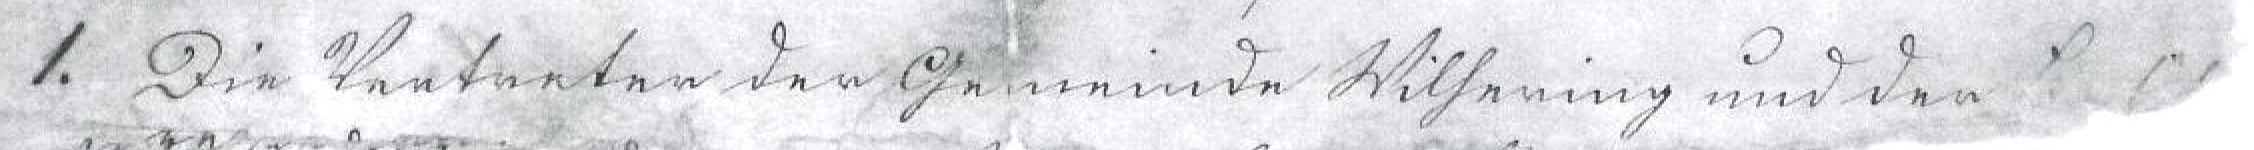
1. Die Vertreter der Gemeinde Wilhering und der
